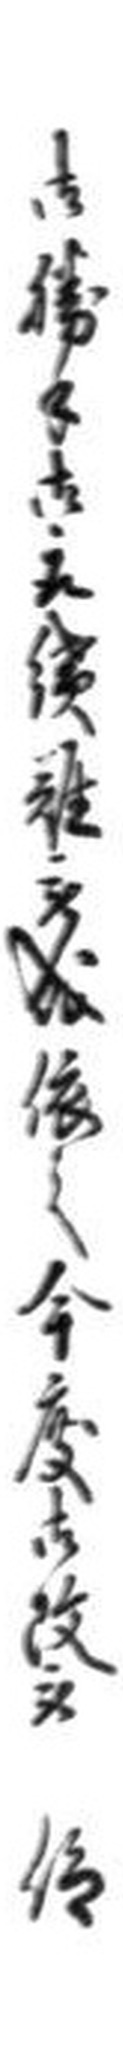御勝手御取続難被成依之今度御改被仰
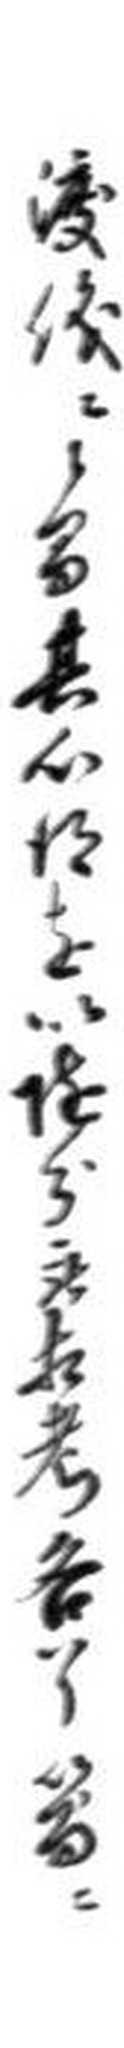渡儀ニ候間其心得を以随分被相考各了簡ニ
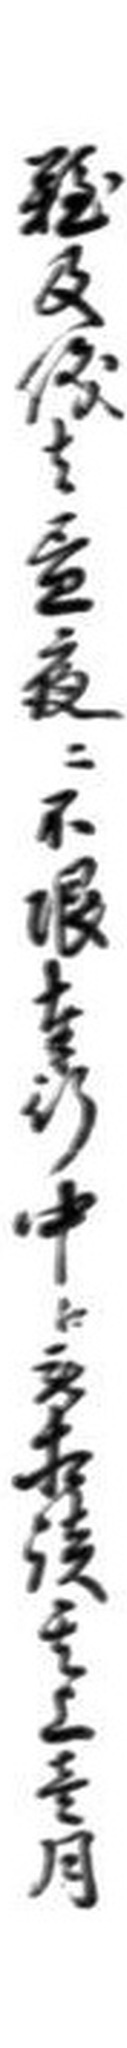難及儀者昼夜ニ不限奉行中江被相談其上壱月
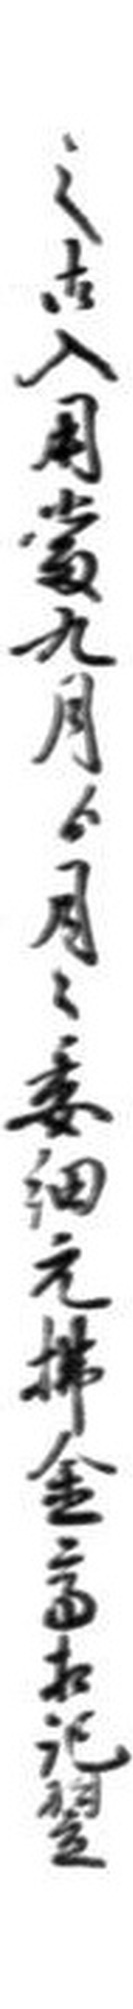之御入用当九月ゟ月々委細元払金高相記翌
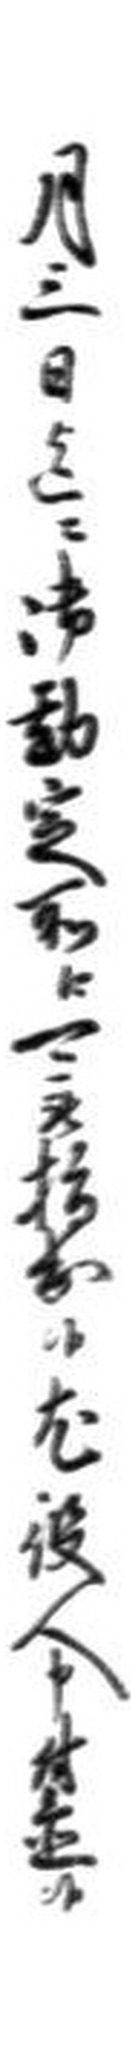月三日迄ニ御勘定所江可指出候尤役人中申付置候
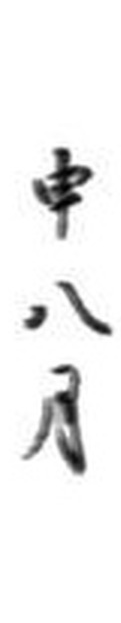申八月
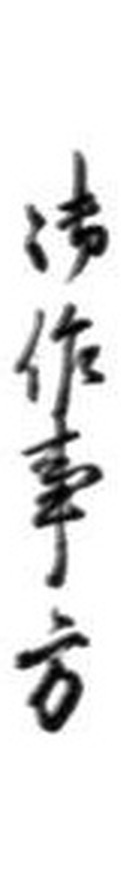御作事方
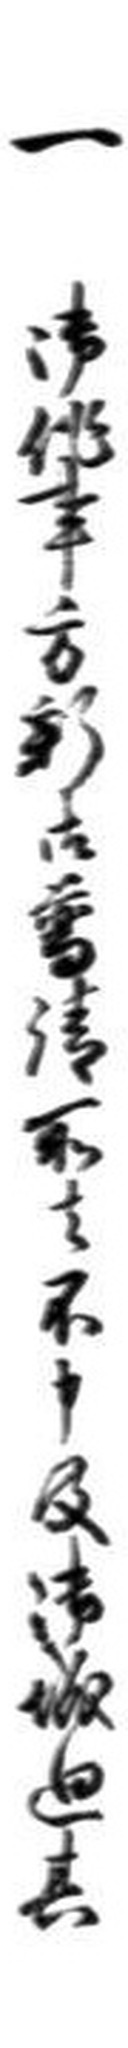一御作事方新御普請所者不申及御城廻其

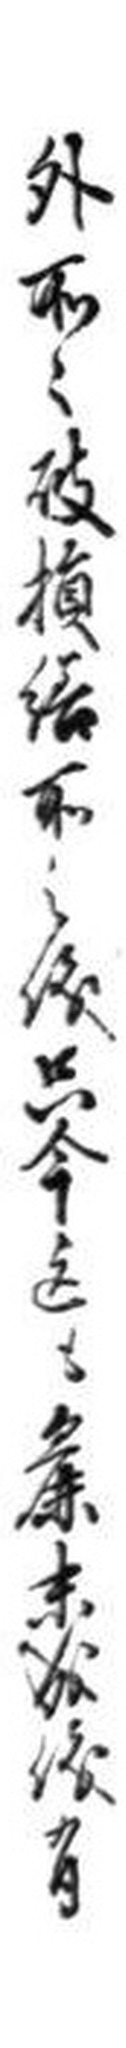外所々破損繕所之儀只今迄も麁末成儀有
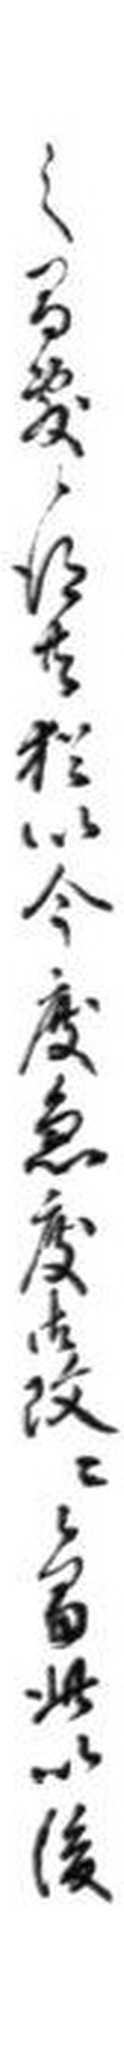之間敷候得共猶以今度急度御改ニ候間此以後
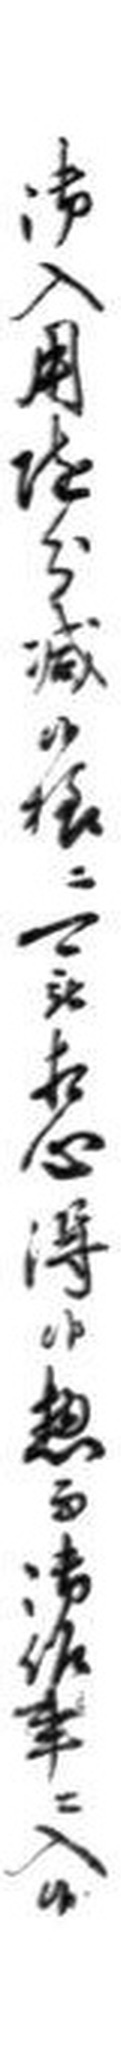御入用随分減候様ニ可被相心得候惣而御作事ニ入候
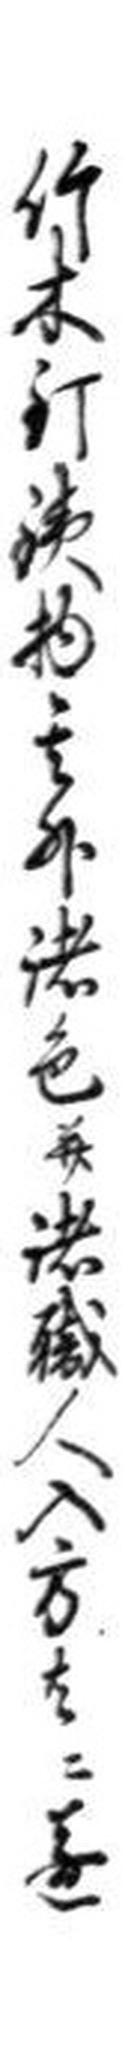竹木釘鉄物其外諸色并諸職人入方共ニ遂
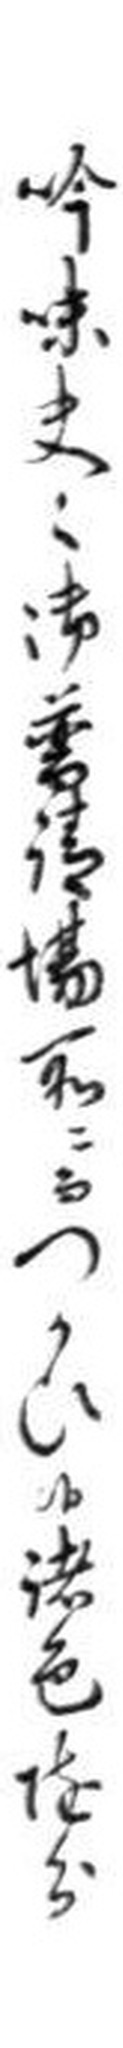吟味夫々御普請場所ニ而つかひ候諸色随分
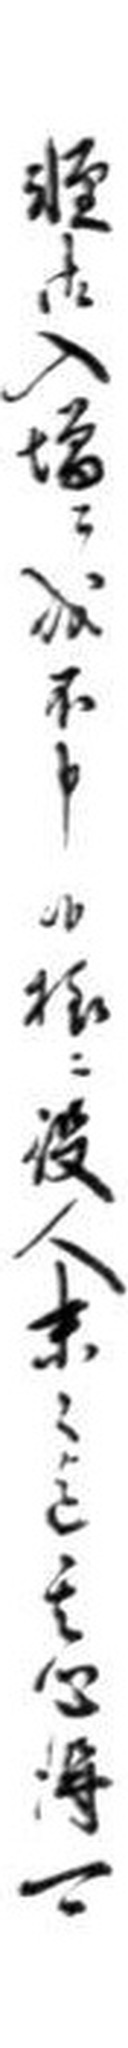軽御入増ニ成不申候様ニ役人末々迄其心得可
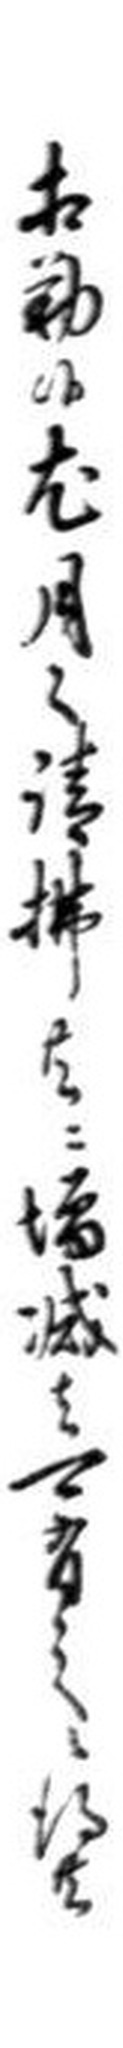相勤候尤月々請払共ニ増減者可有之候得共
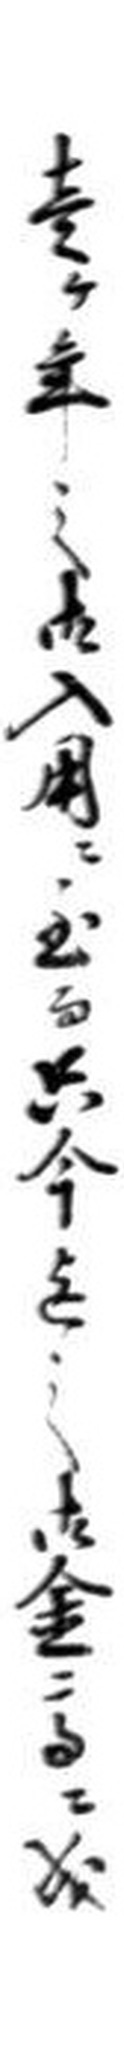壱ヶ年之御入用ニ至而只今迄之御金高ニ成
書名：家譜 三十一 吉邦公 享保元年
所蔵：福井県文書館 Fukui Prefectural Archives
